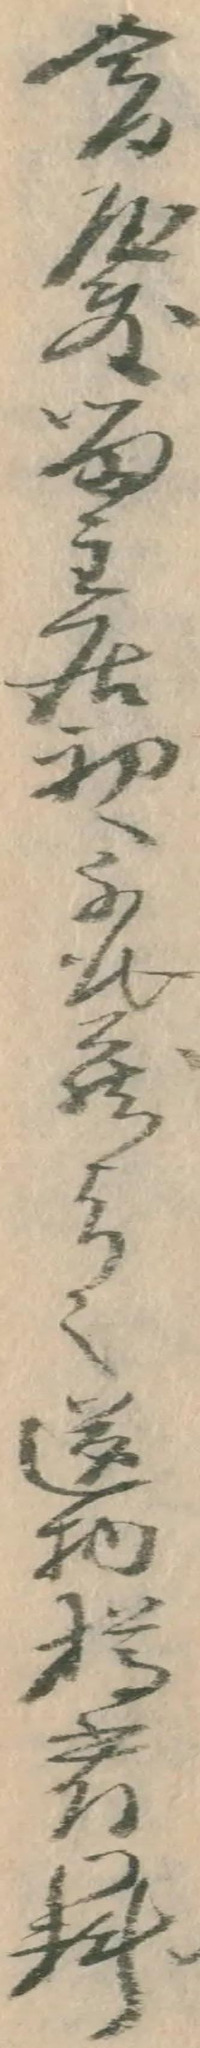今日屋敷留主居初へ千本蔵より之送物樽肴同料

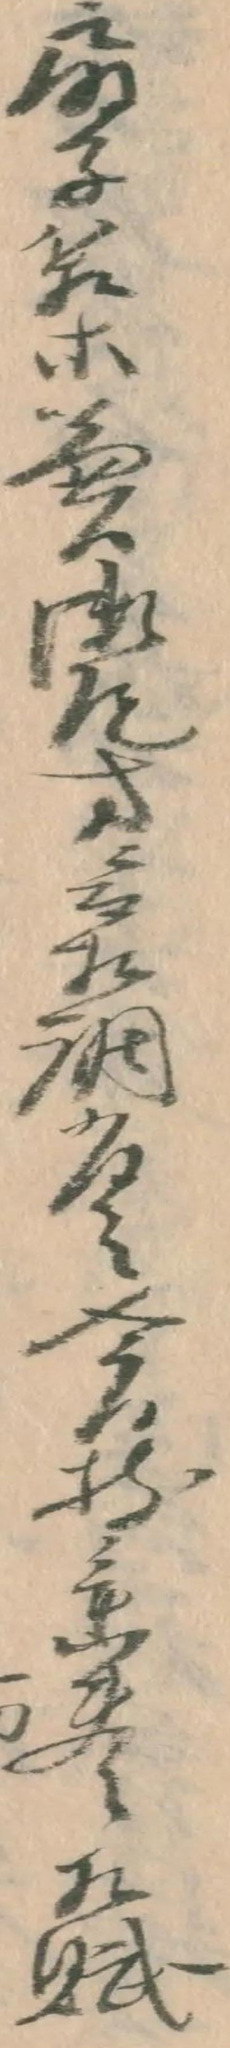扇子箱等兼日瀬尾方ニ而相調有之今日持参夫々相賦
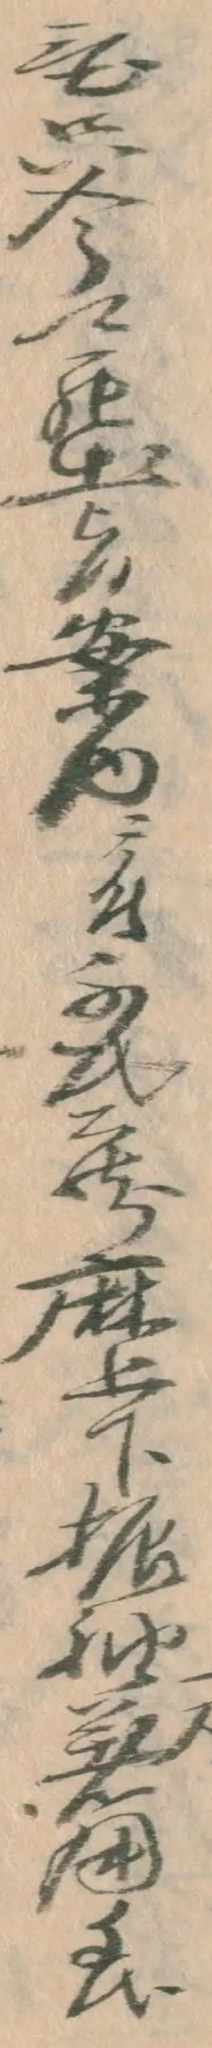置只今可罷出旨案内ニ付千代蔵麻上下振袖一刀着用手代
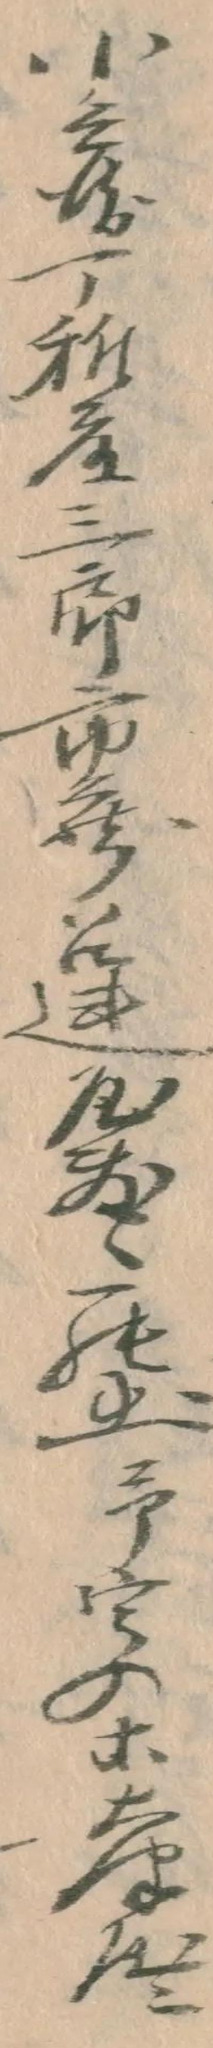小兵衛丁稚藤三郎市蔵召連屋敷へ罷出予うの等大津屋に
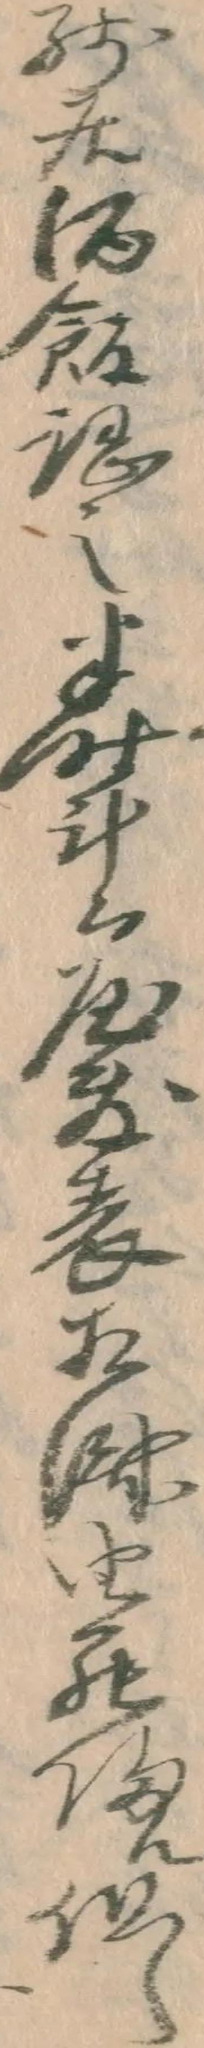残居酒飯認之半時斗而屋敷表相済由罷帰ル但し
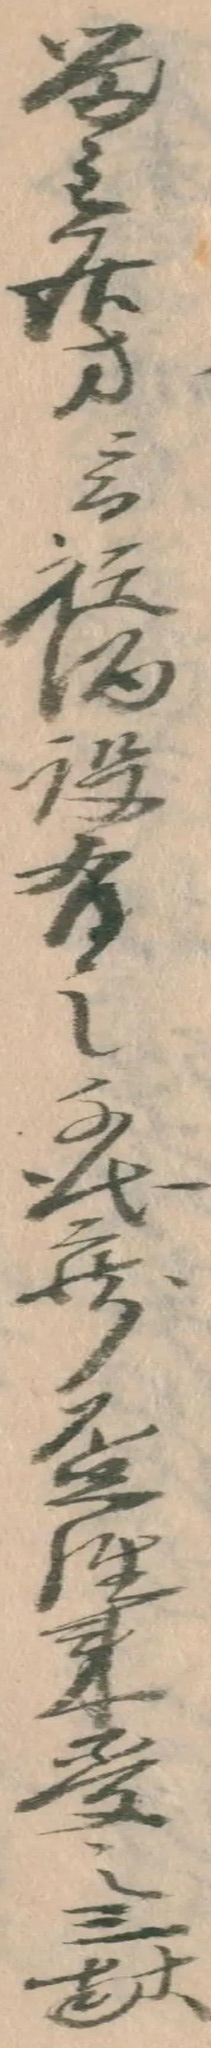留主居方ニ而祝酒役有之千代蔵盃往来受之三十
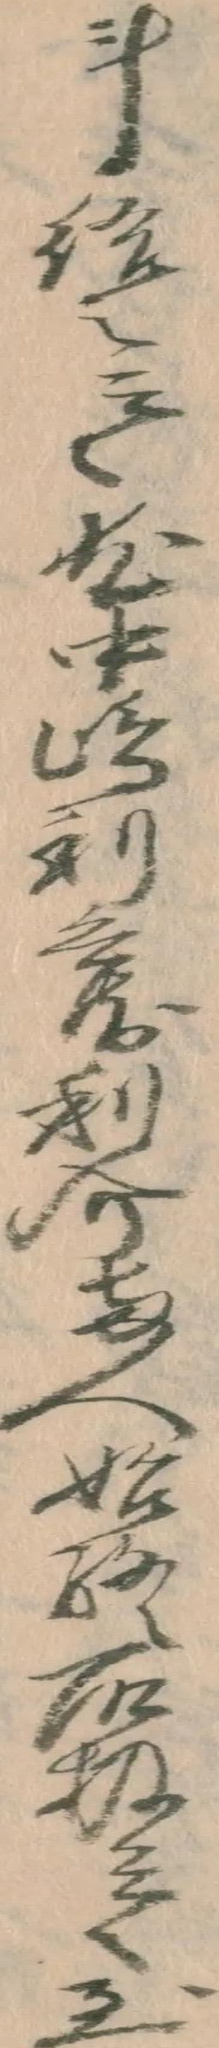斗後之云々尤中嶋利兵衛利介両人始終取扱云々至
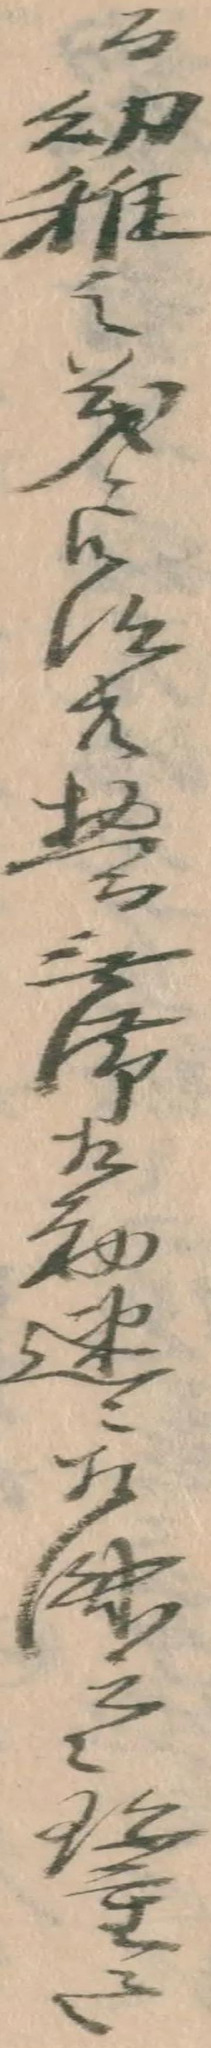而幼稚之義ニ候得共惣而無滞相勤速に相済云々趣重々々
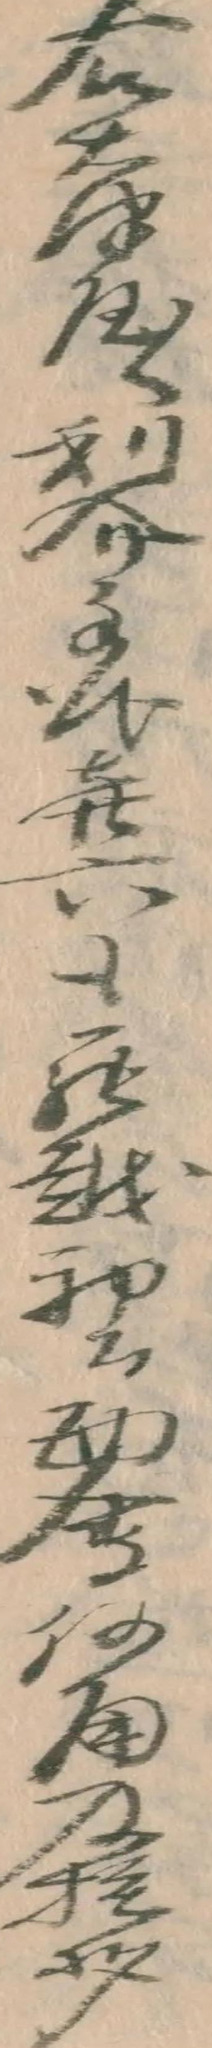右大津屋へ利介手代并喜六郎罷越初而面會何角及挨拶
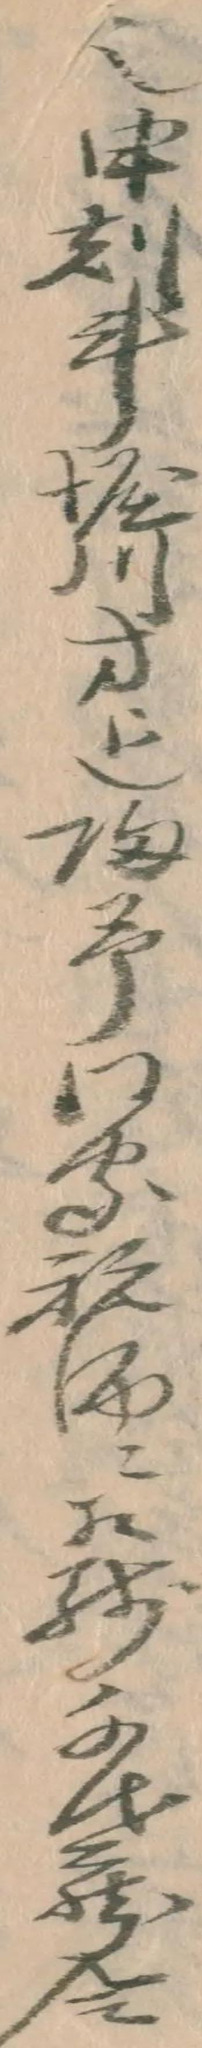也申刻斗堀川方迄帰予同家祝酒に相残千代蔵令
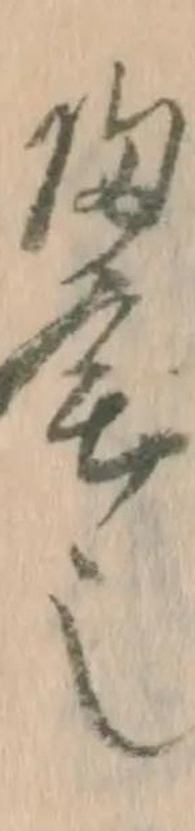帰宅也
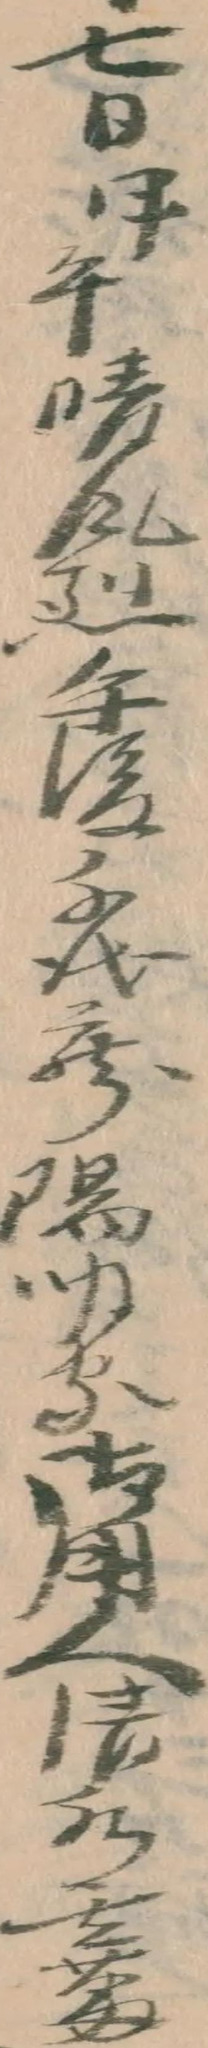十七日甲午晴風烈午後千代蔵陽明家御用人清水玄蕃
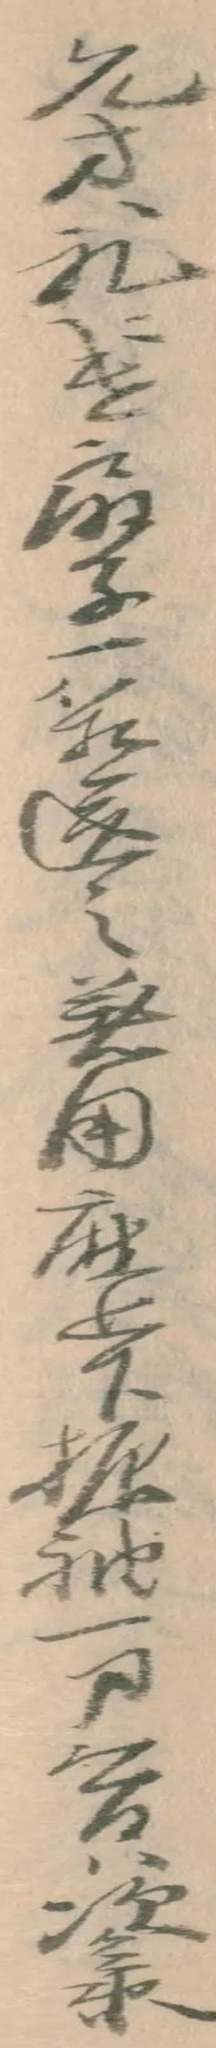允方へ礼に遣扇子一箱送之着用麻上下振袖一刀今日ハ次兵衛
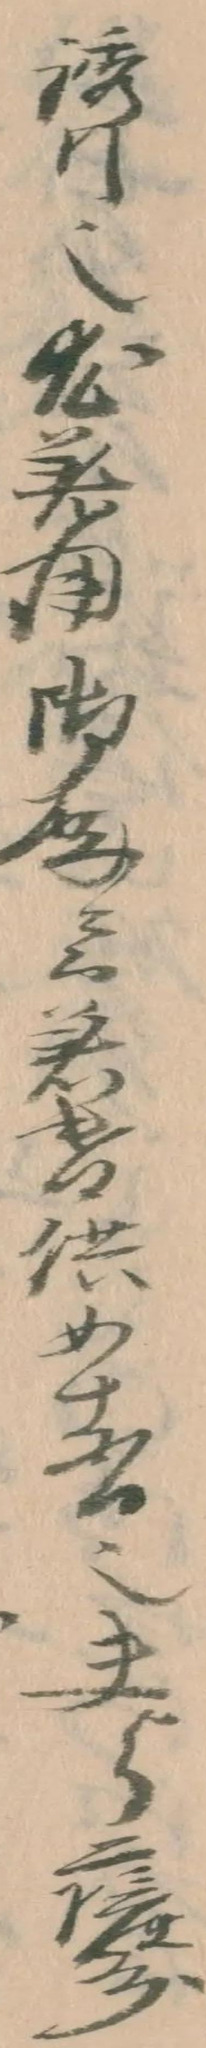誘引也尤着用御殿二而若者供如十五日也夫より薩州
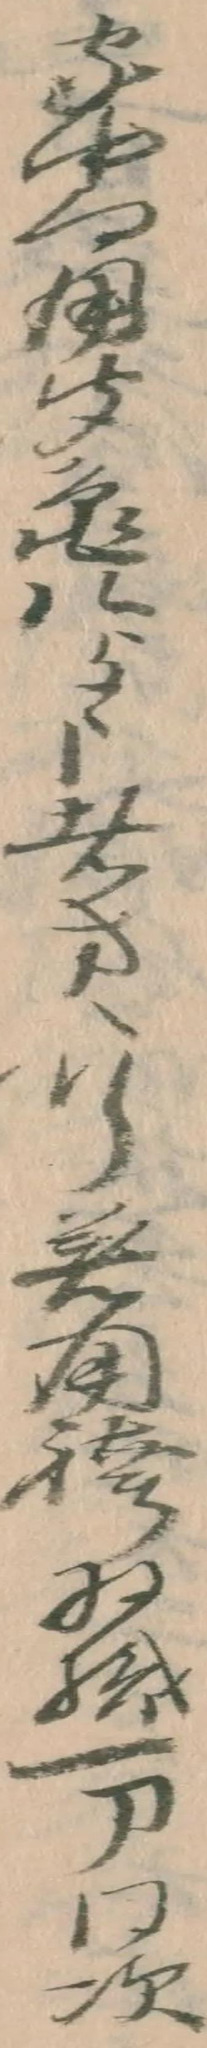家中向用聞亀八と申者方へ引着用袴羽織一刀同次
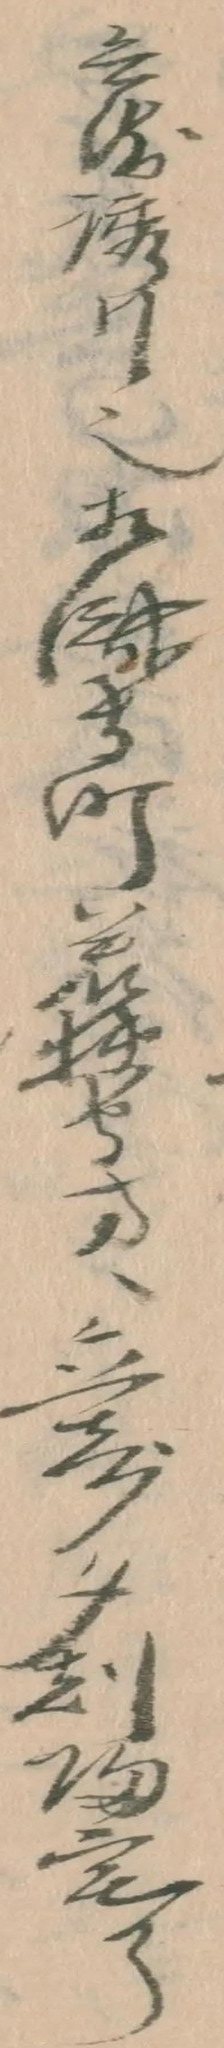兵衛誘引也相済寺町若狭守方へ立寄夕刻帰宅了
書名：賀茂社記録. 第67冊
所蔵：国立国会図書館 National Diet Library, JAPAN
